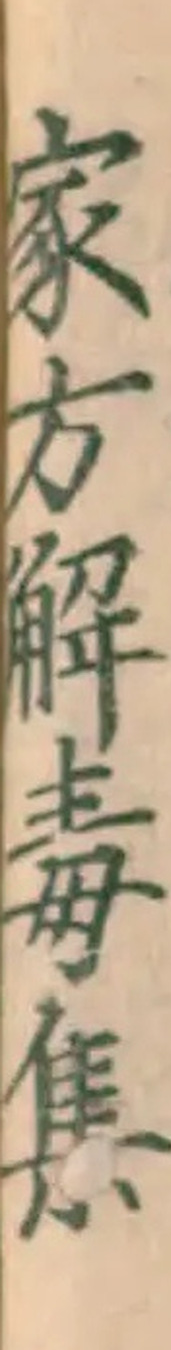家方解毒集
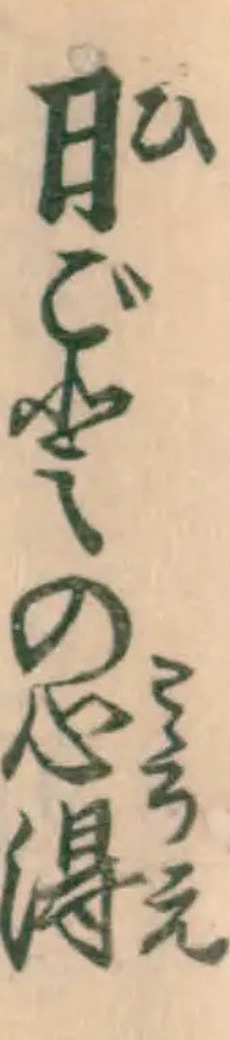日ごとの心得
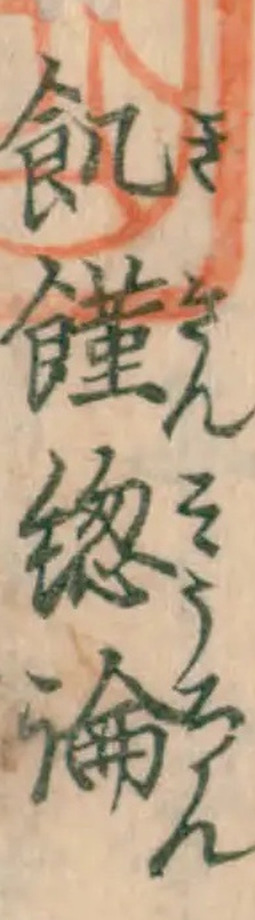飢饉総論
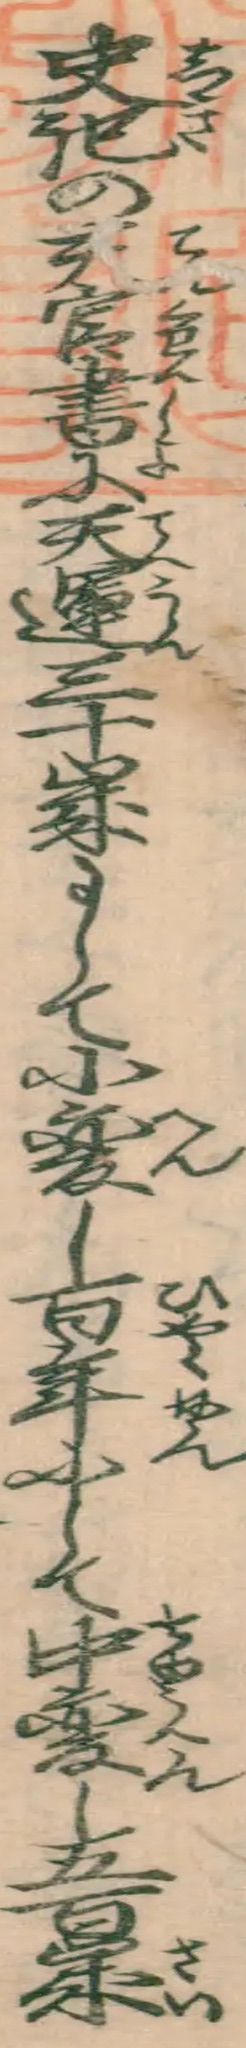史記の天官書に天運三十歳にして小変し百年にして中変し五百歳
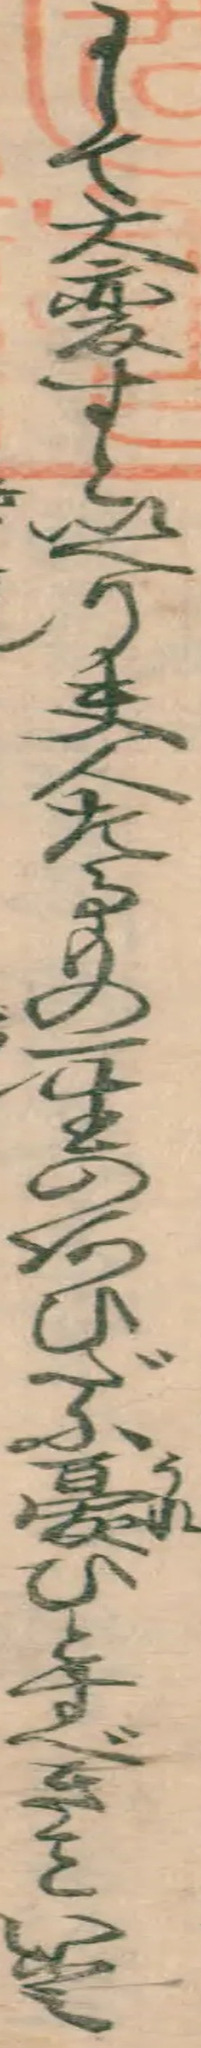にして大変すといへり夫人たるもの一生のあひだに憂ひとすべきこといと
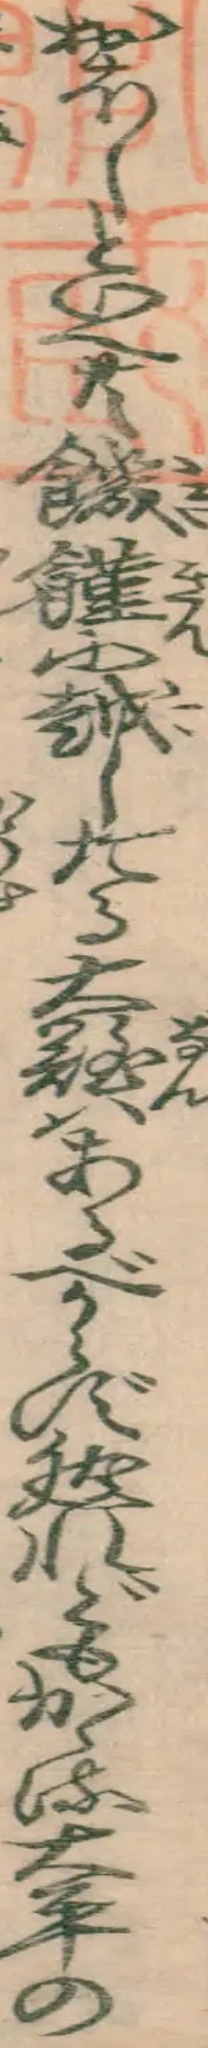おほしといへ共饑饉に越したる大難はあるべからず然れどもかゝる大平の
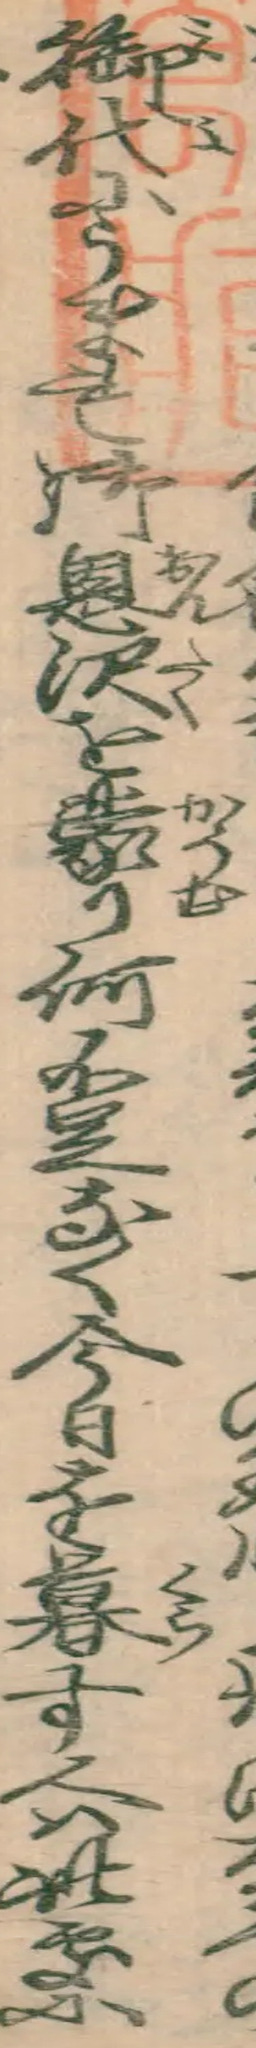御代にうまれ御恩沢を蒙り何不足なく今日を暮す人は此処に
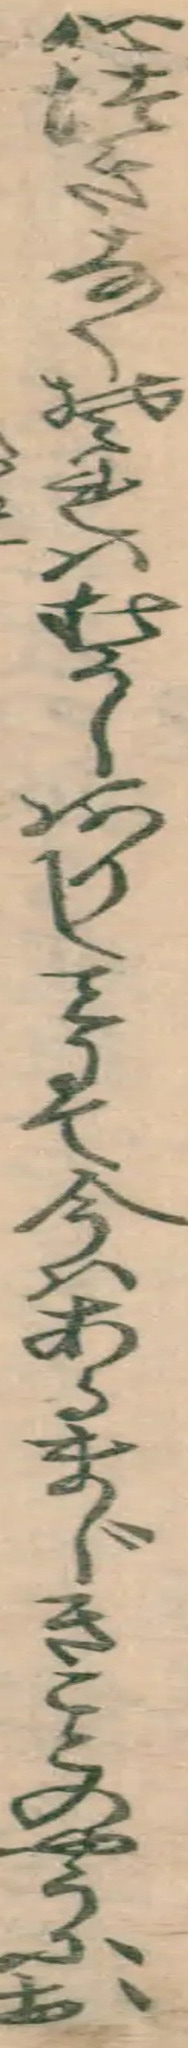心つたなくそれはむかしありしことにて今はあるまじきことのやうにお
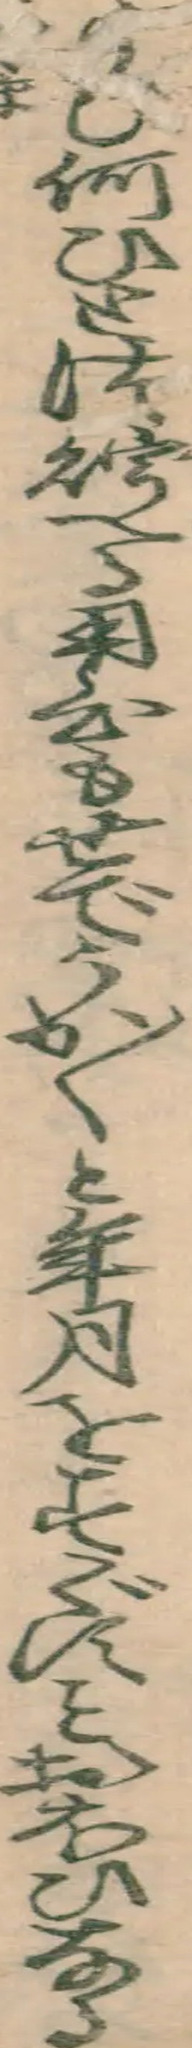もひ何ひとつ貯へる用心もせでうか〳〵と年月をすごすことおほひなる
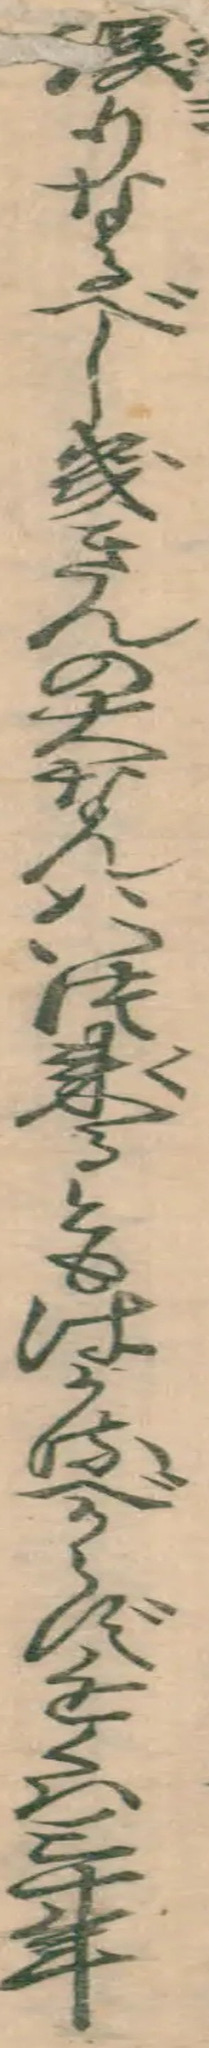誤りなるべしききんの大なんはいつ来るともはかるべからず近くは三十年

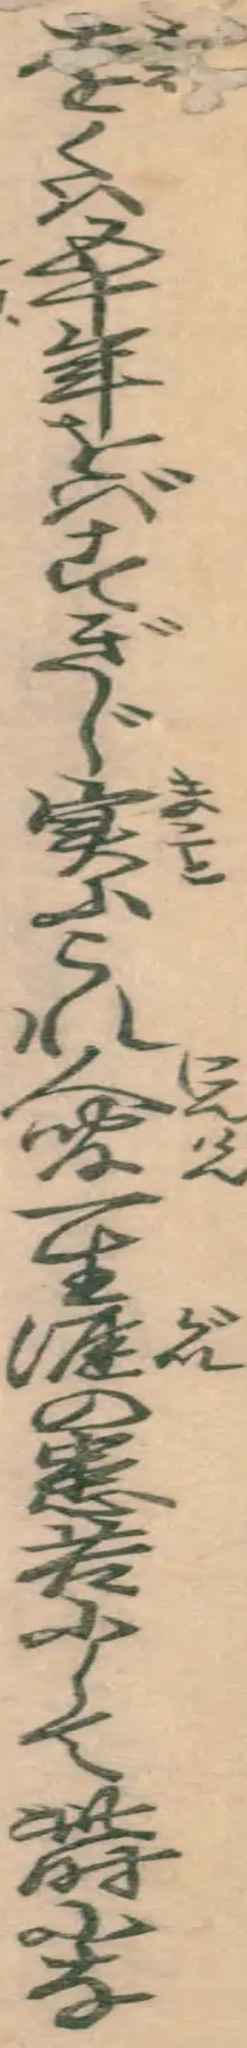遠くは五十年をばすぎじ実にこれ人間一生涯の患苦にして此時にな
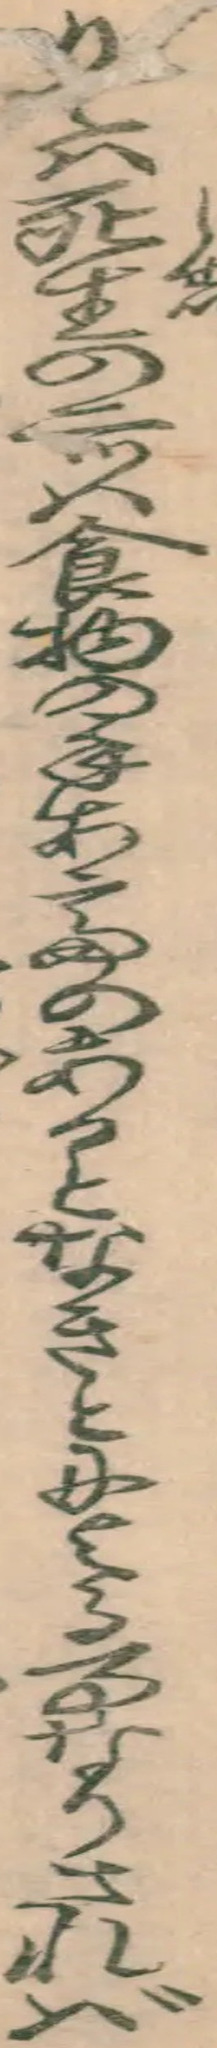りては死生の二ッは食物の手あてのあるとなきとによる事なりされば
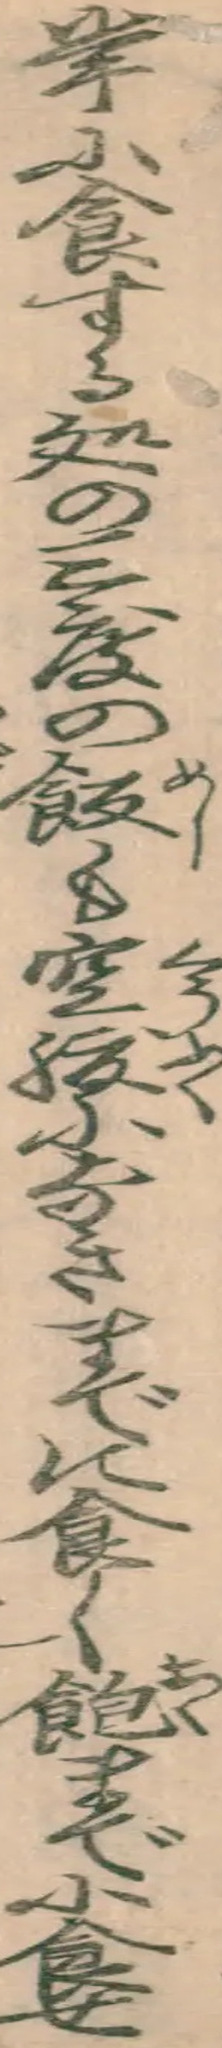常に食する処の三度の飯も空腹になきまでに食し飽までに食せ
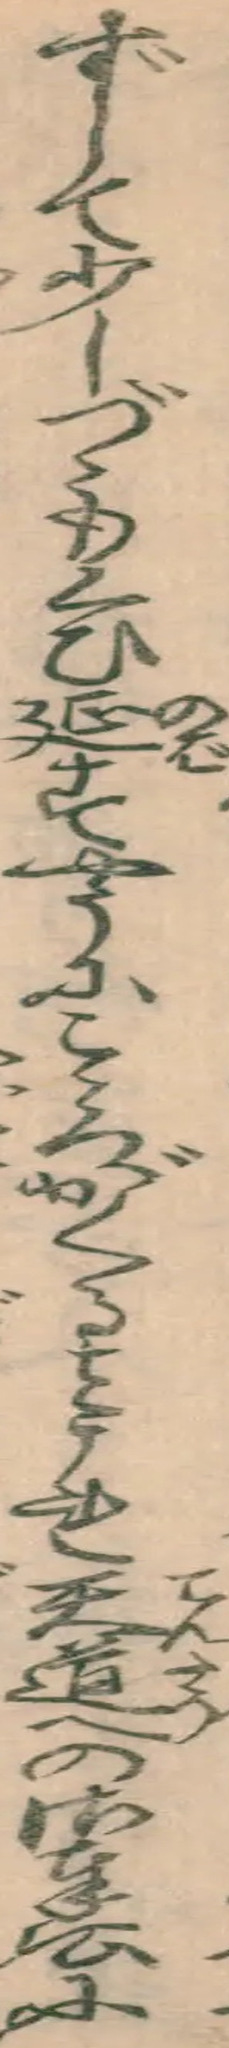ずして少しづゝもくひ延すやうにこゝろがくることこれ天道への御奉公に
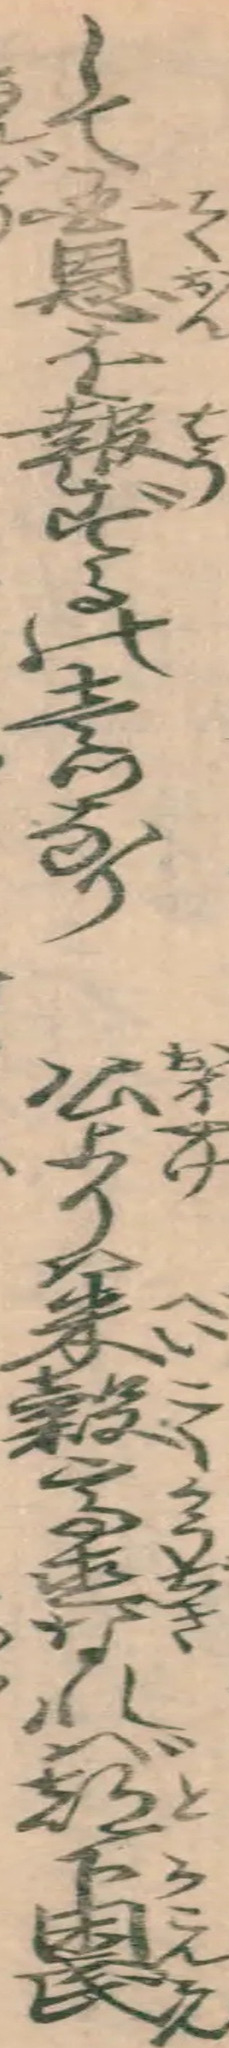して国恩を報ずるの壱つなり公よりは米穀高直なれば都下困民
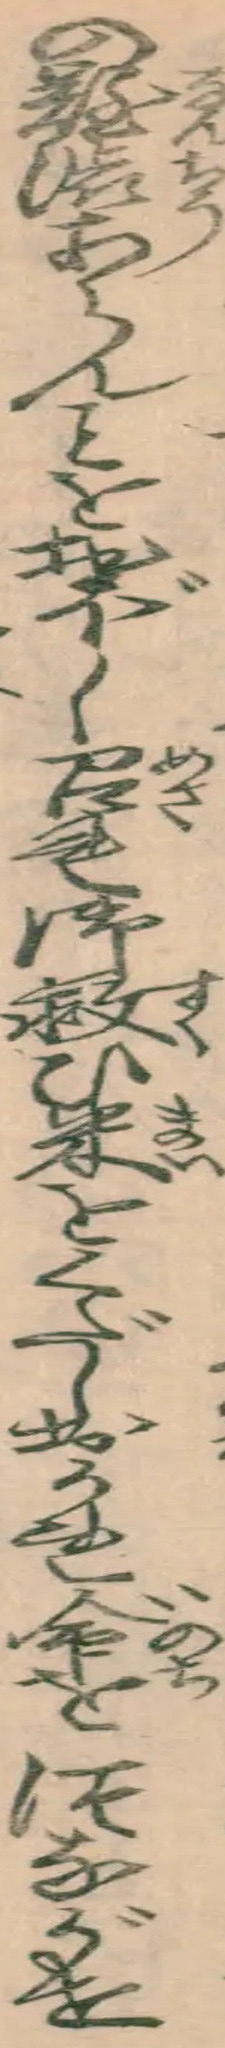の難渋あらんことをおぼし召れ御救ひ米をくだしおかれ命をつながせ
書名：日ごとの心得
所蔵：国立国会図書館 National Diet Library, JAPAN
